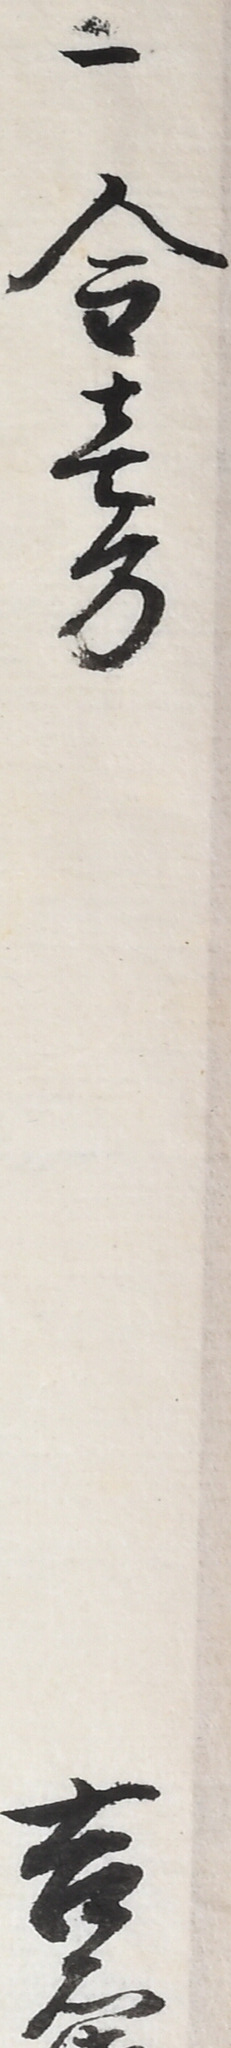一金壱分吉右衛門
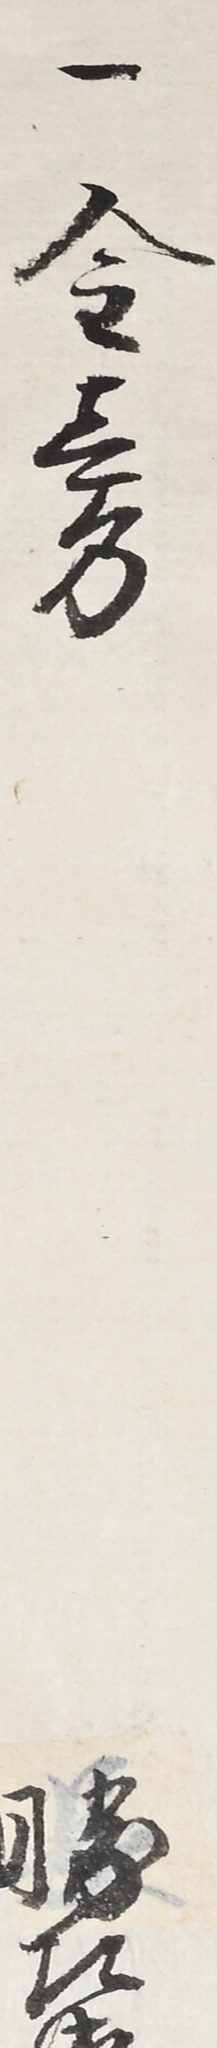一金壱分勝左衛門
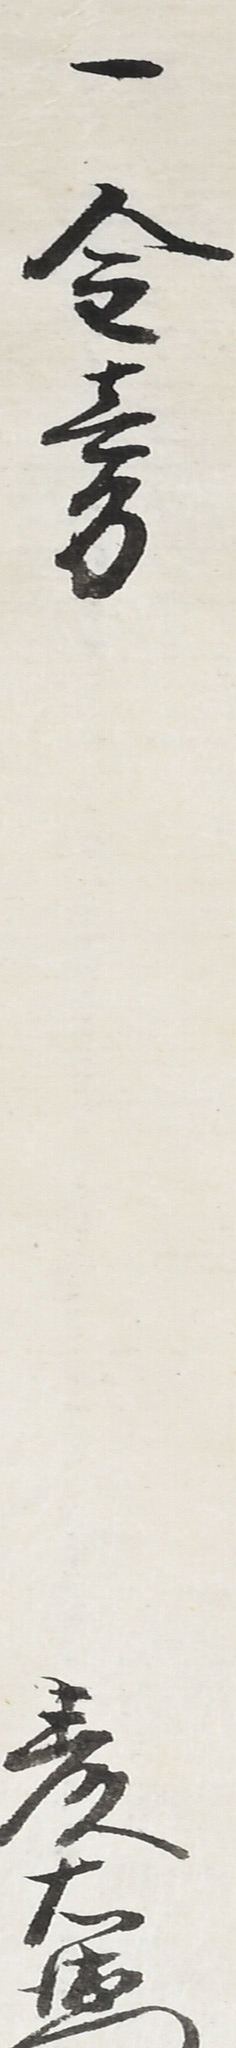一金壱分彦右衛門
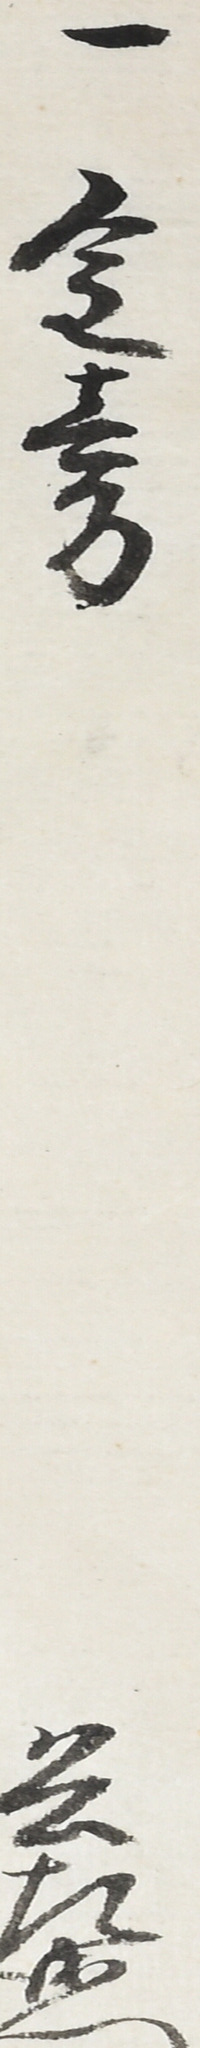一金壱分九兵衛

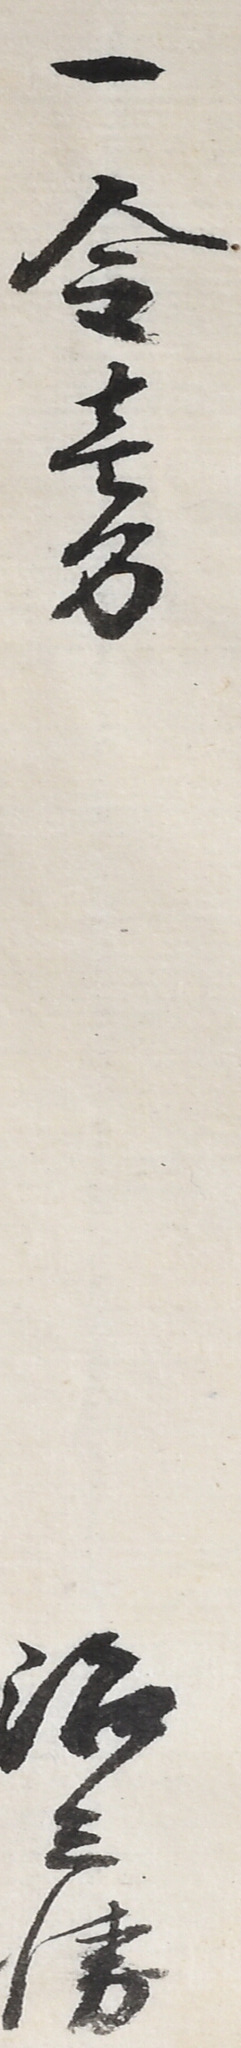一金壱分治兵衛
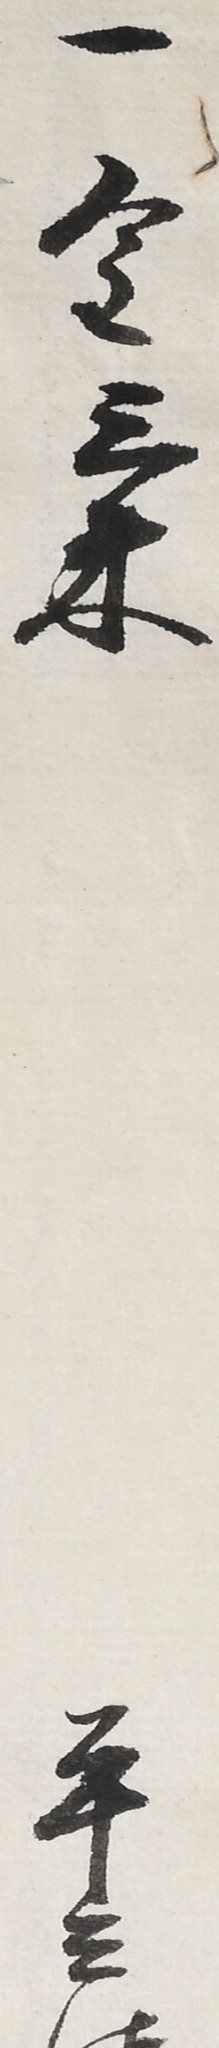一金三朱平兵衛
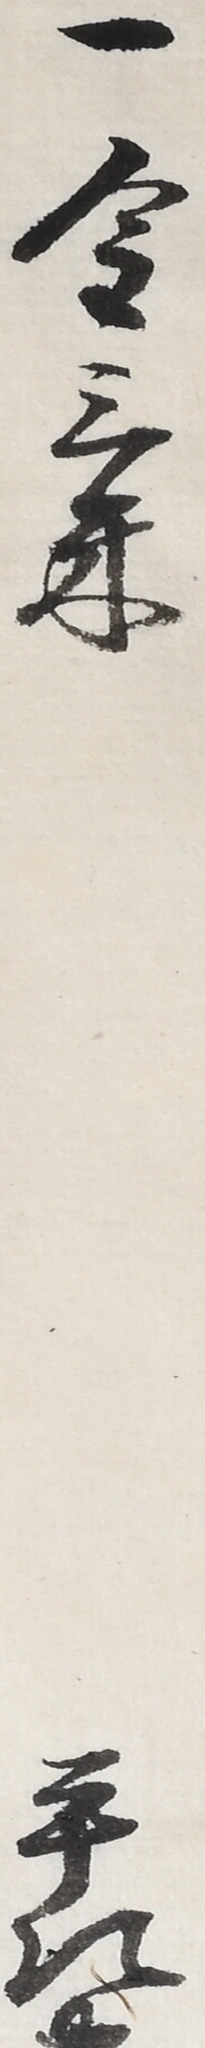一金三朱平兵衛
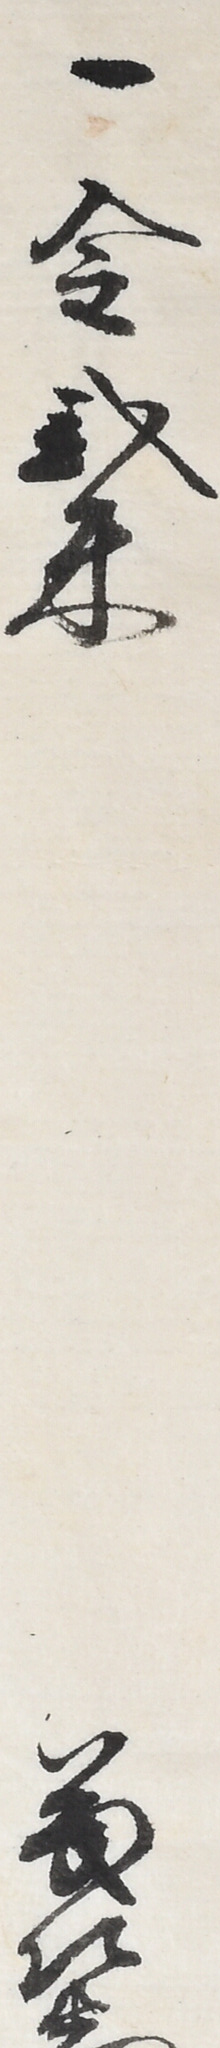一金弐朱忠兵衛
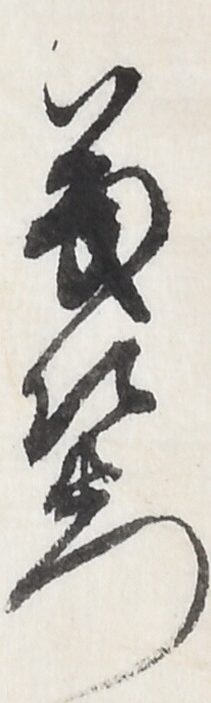五郎右衛門
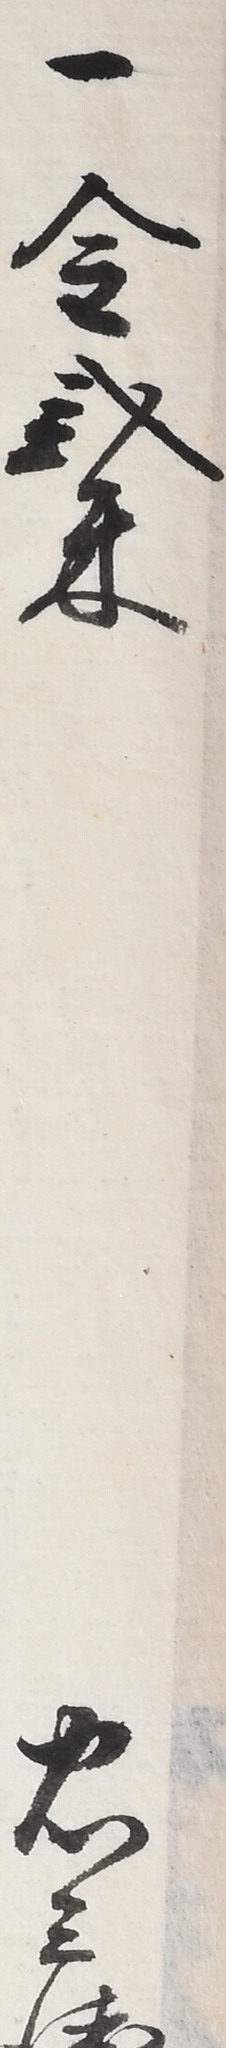一金弐朱成三郎
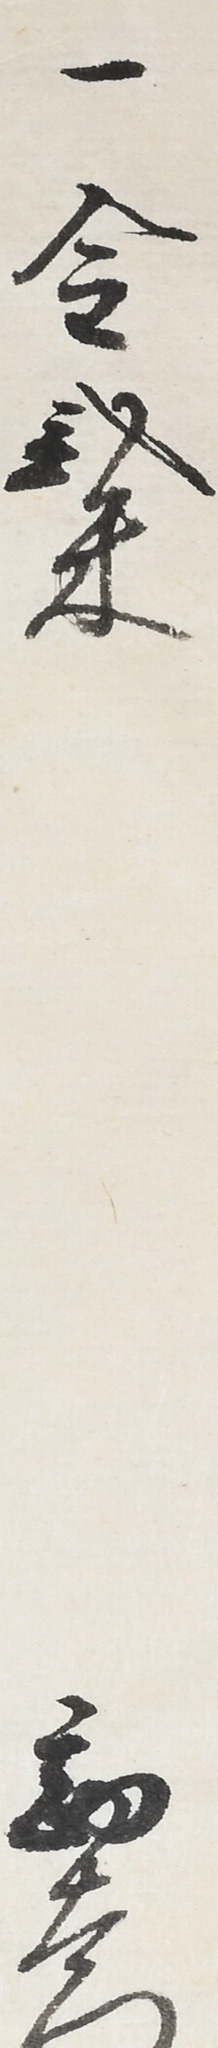一金弐朱勘右衛門
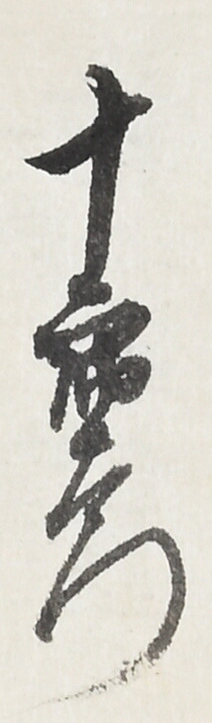五郎右衛門
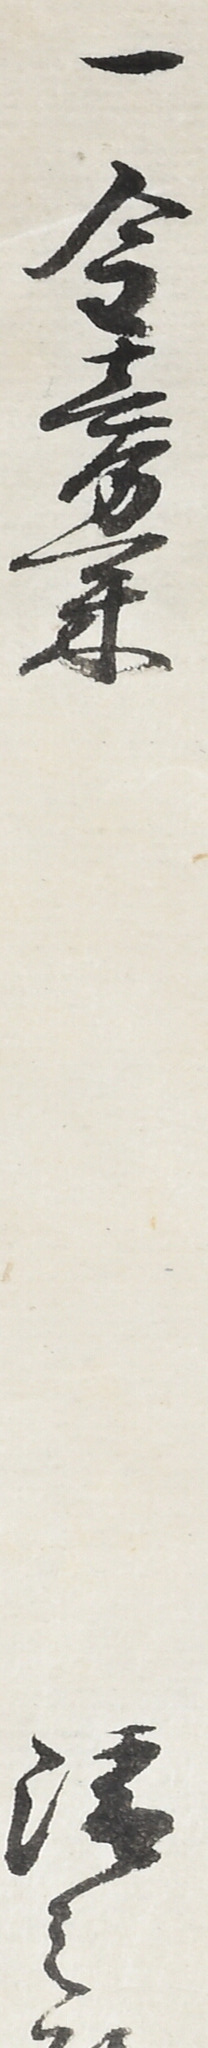一金壱分一朱清之丞
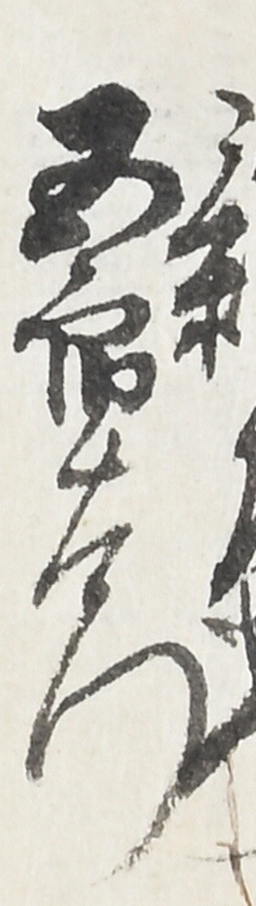五郎右衛門

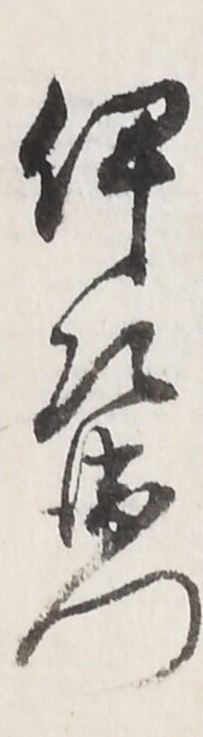茂左衛門
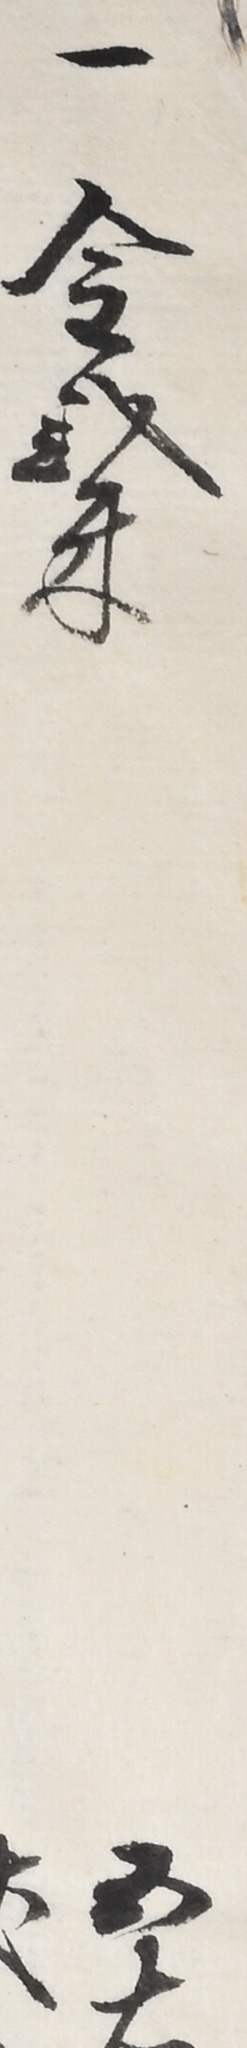一金弐朱伴蔵
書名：御拝地百五拾年御祝儀献上御目録名前
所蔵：伊那市立高遠町図書館・合同会社AMANE
